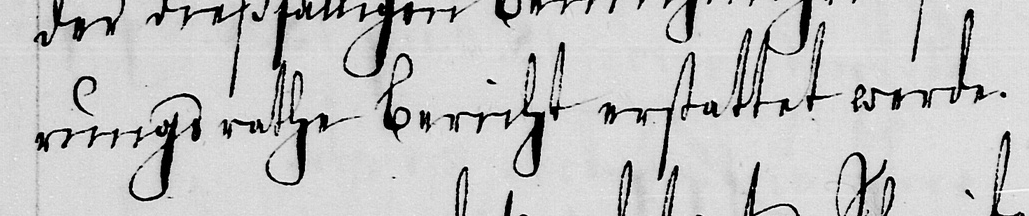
rungsrathe Bericht erstattet werde.
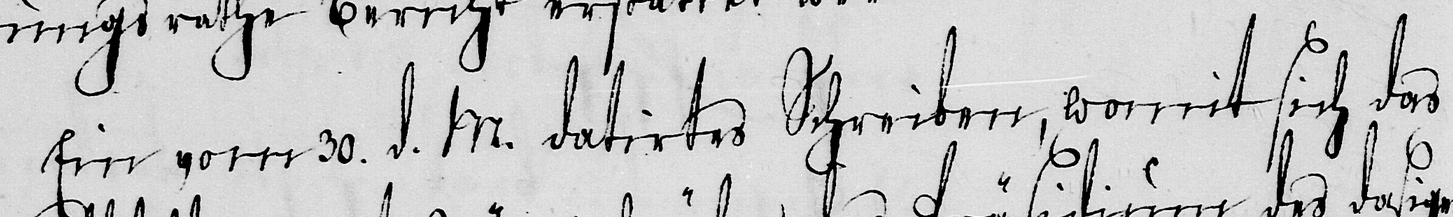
Ein vom 30. d. M. datirtes Schreiben, womit sich das
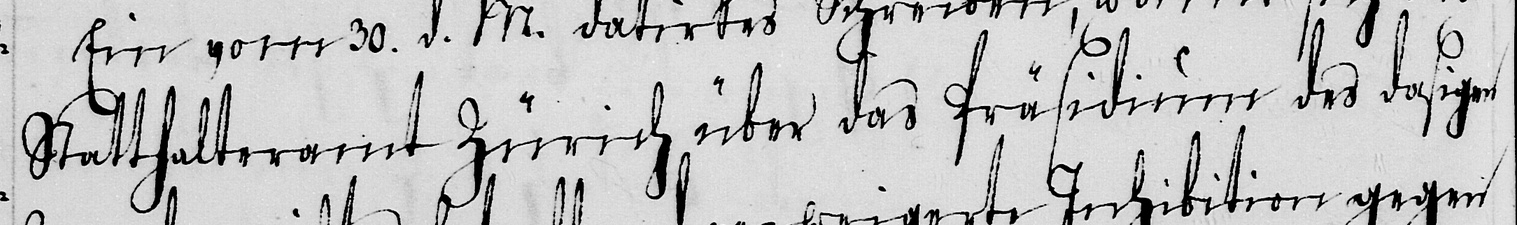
Statthalteramt Zürich über das Präsidium des dasigen
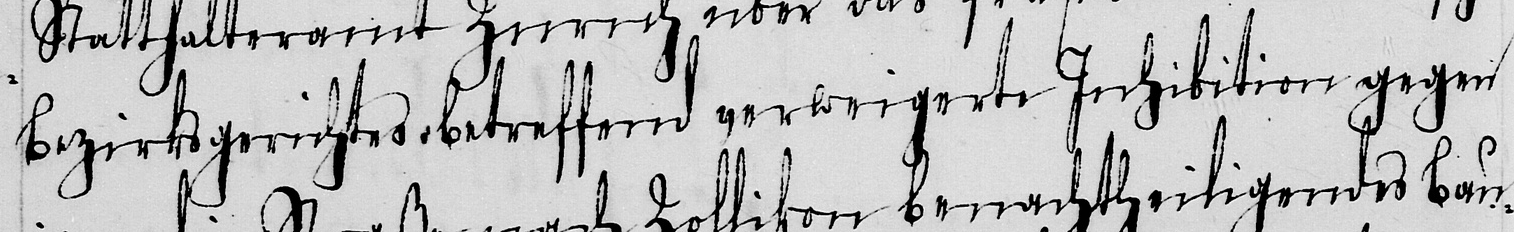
Bezirksgerichtes betreffend verweigerte Inhibition gegen
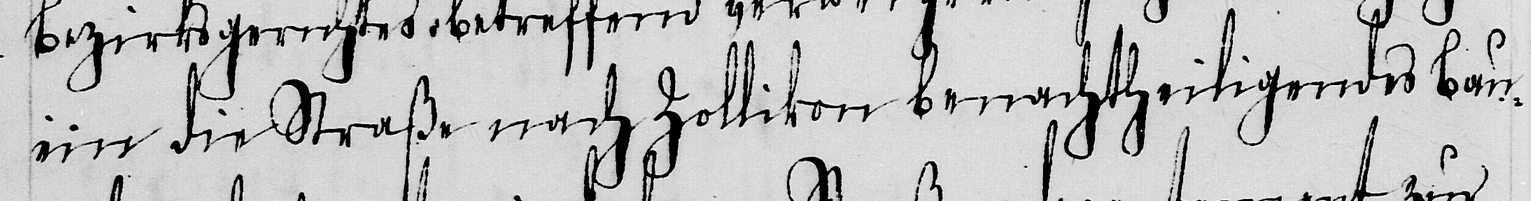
ein die Straße nach Zollikon benachtheiligendes Bau¬
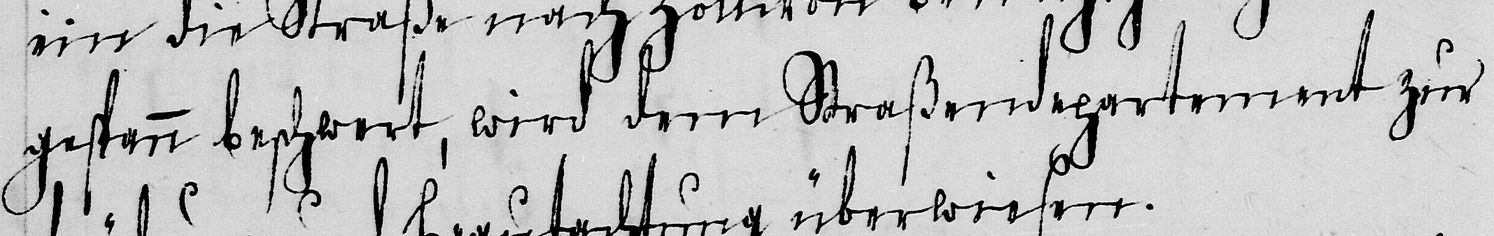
gespann beschwert, wird dem Straßendepartement zur
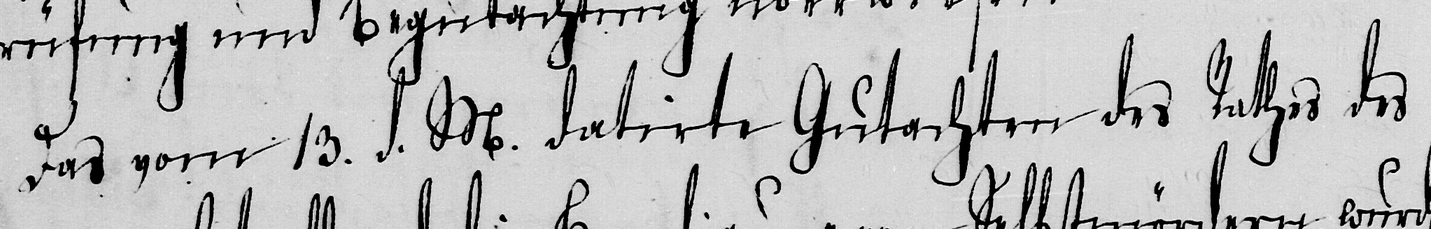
Das vom 13. d. M. datirte Gutachten des Rathes des
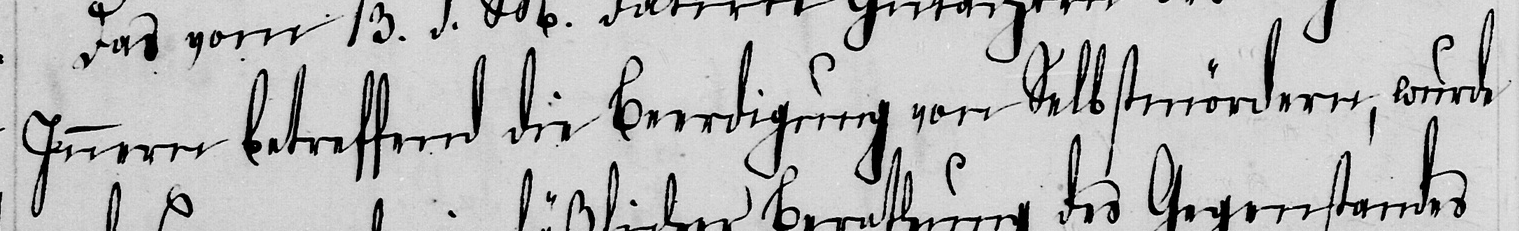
Innern betreffend die Beerdigung von Selbstmördern, wurde
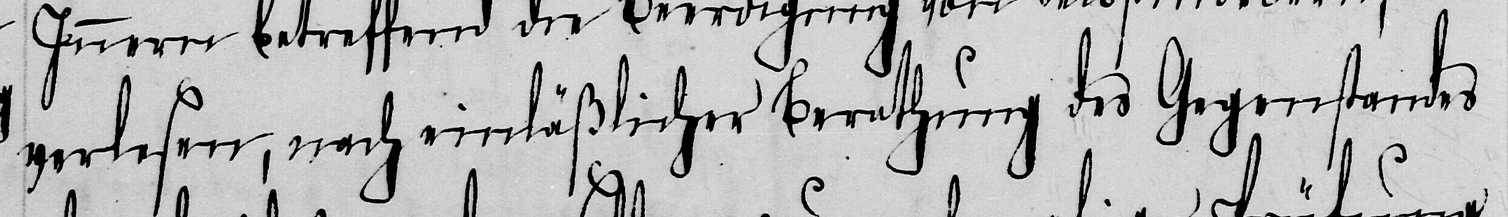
verlesen, nach einläßlicher Berathung des Gegenstandes
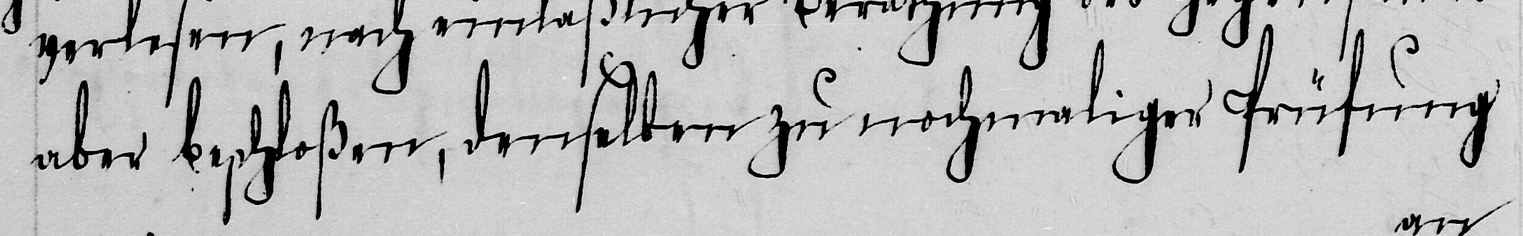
aber beschloßen, denselben zu nochmaliger Prüfung
